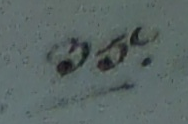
35.
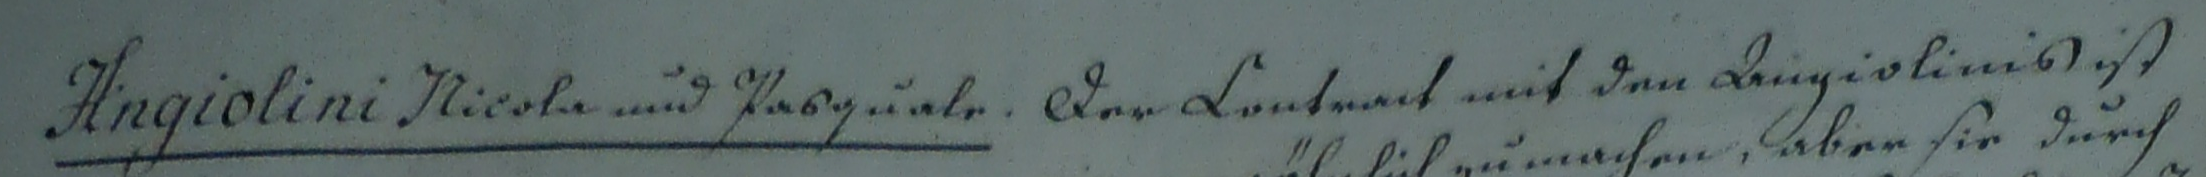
Angiolini Nicola und Pasquale. Der Contract mit den Angiolinis ist
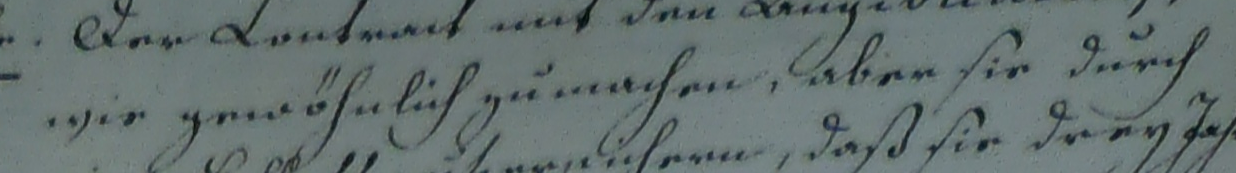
wie gewöhnlich zumachen, aber sie durch
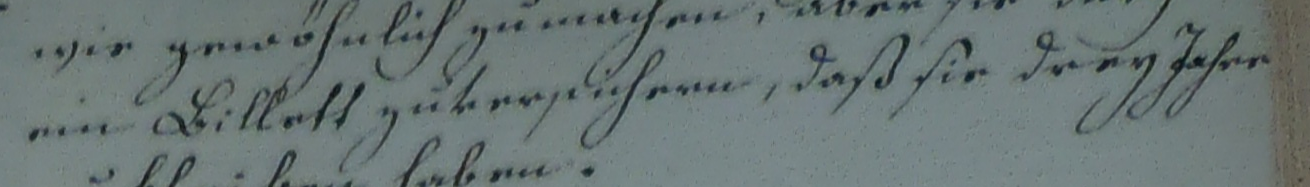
ein Billett zuversichern, daß sie drey Jahre
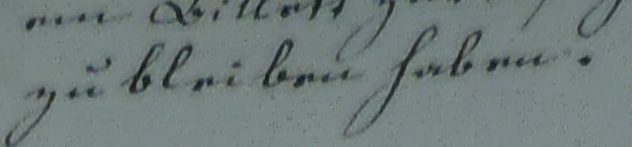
zu bleiben haben.
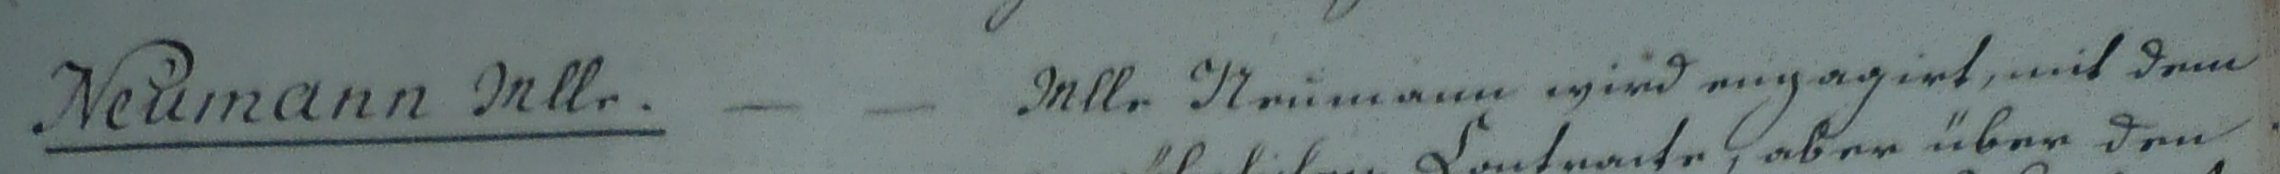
Neumann Mlle. _ _ Mlle Neumann wird engagirt, mit dem
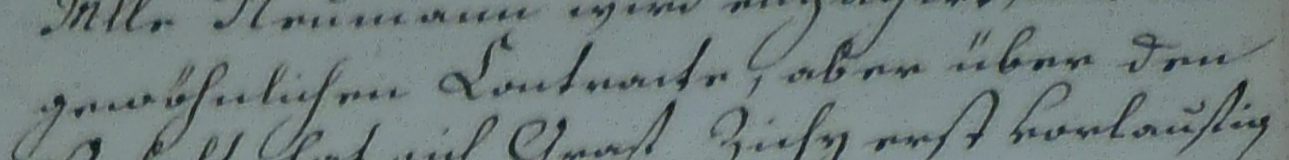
gewöhnlichen Contracte, aber über den
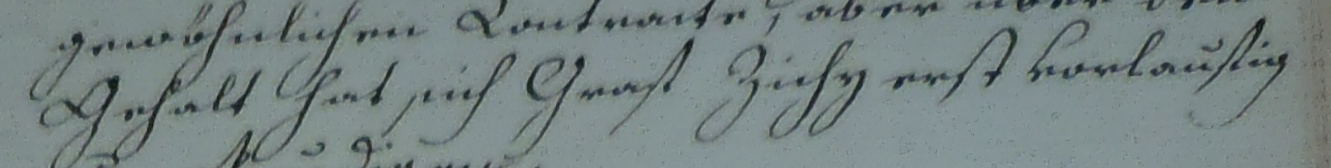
Gehalt hat sich Graf Zichy erst vorläufig
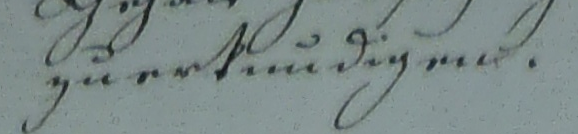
zu erkundigen.
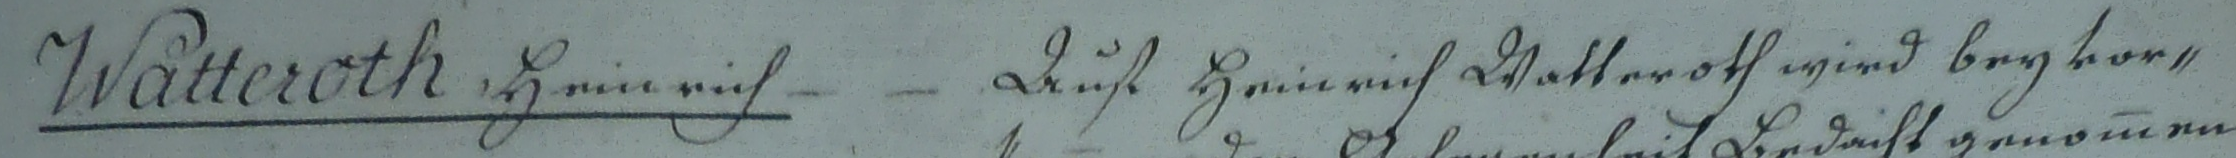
Watteroth, Heinrich _ _ Auf Heinrich Watteroth wird bey vor¬
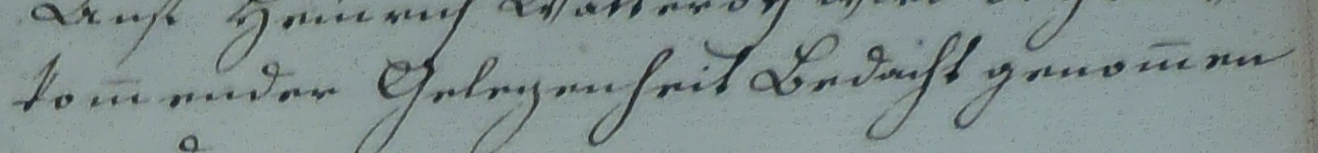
kom̅ender Gelegenheit Bedacht genom̅en
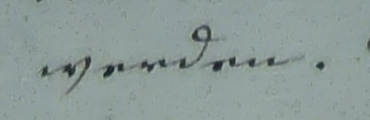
werden.
